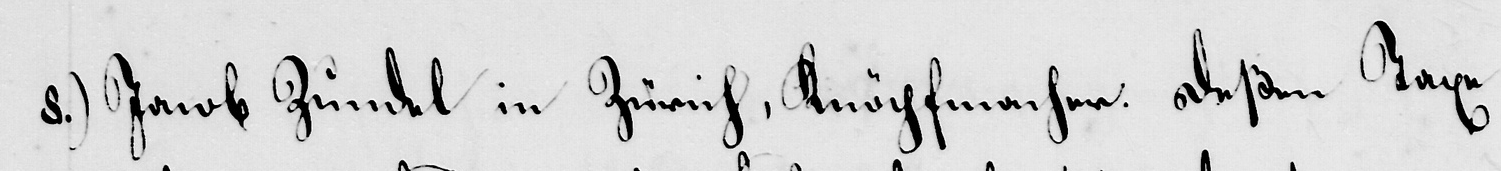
8.) Jacob Zundel in Zürich, Knopfmacher. Deßen Taxe
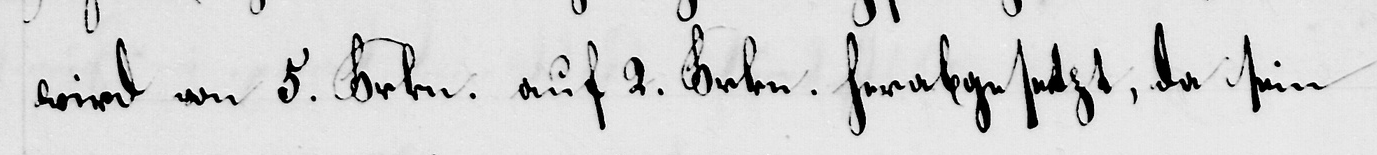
wird von 5. Frkn. auf 2. Frkn. herabgesetzt, da sein
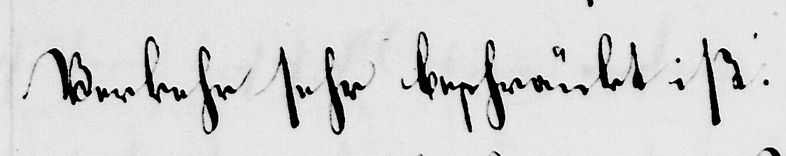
Verkehr sehr beschränkt ist.
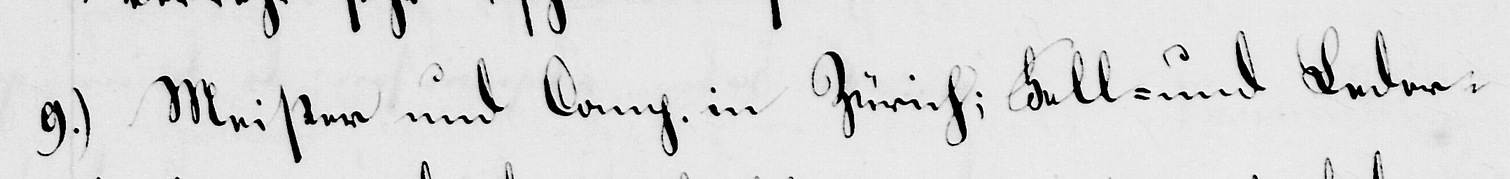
9.) Meister und Comp. in Zürich; Fell- und Leder¬
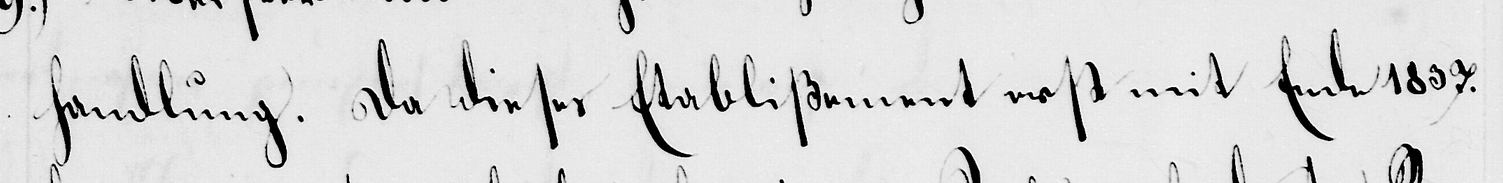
handlung. Da dieses Etablißement erst mit Ende 1837.
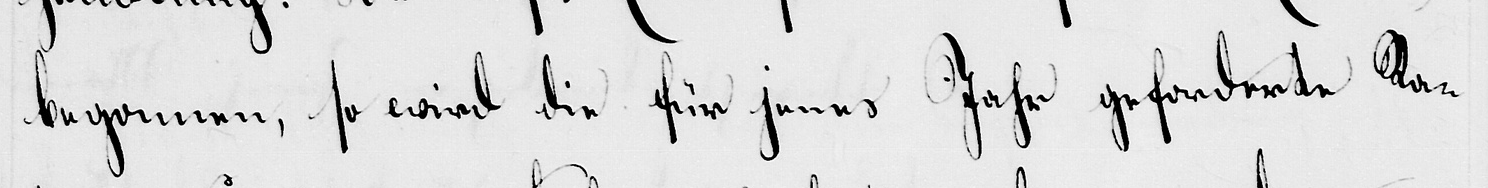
begonnen, so wird die für jenes Jahr geforderte Ra¬
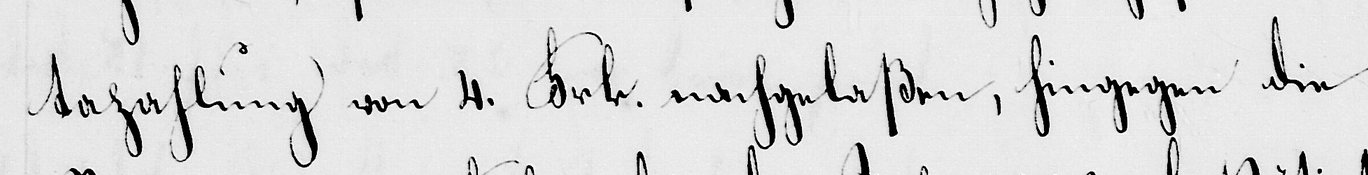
tazahlung von 4. Frk. nachgelaßen, hingegen die
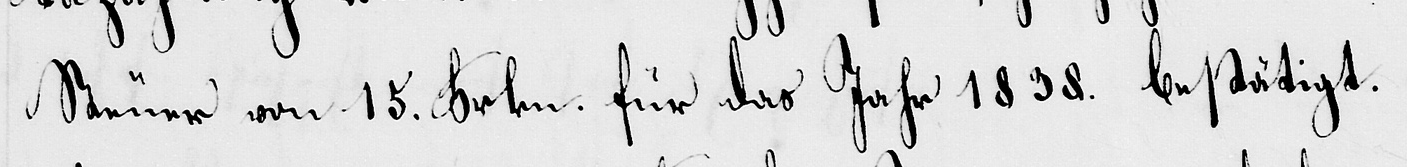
Steuer von 15. Frkn. für das Jahr 1838. bestätigt.
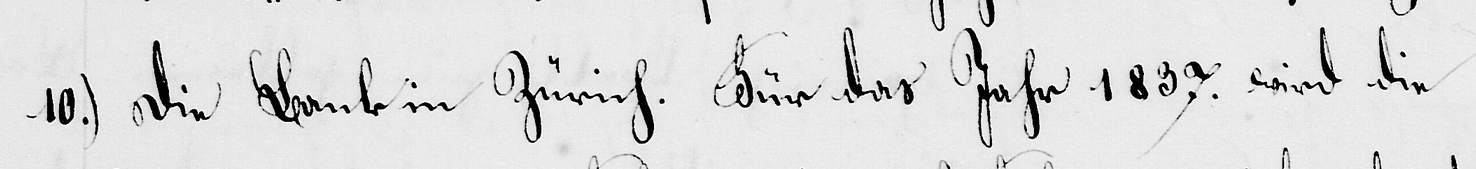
10.) Die Bank in Zürich. Für das Jahr 1837. wird die
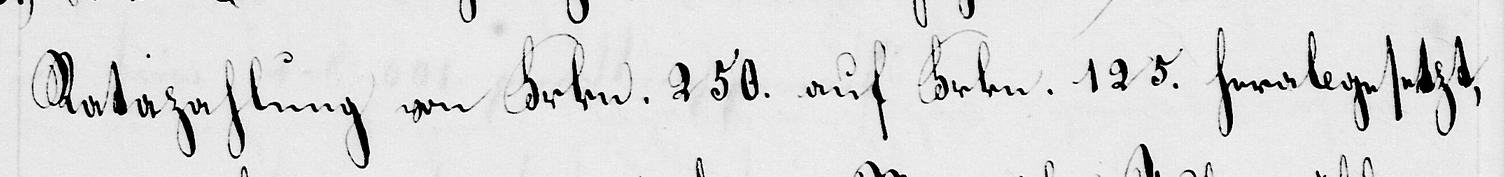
Ratazahlung von Frkn. 250. auf Frkn. 125. herabgesetzt,
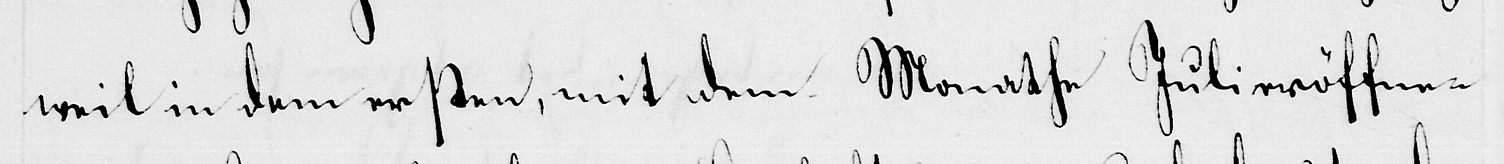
weil in dem ersten, mit dem Monathe Juli eröffne¬
